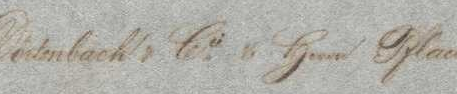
Dörtenbach & Cie & Herrn Pflaum
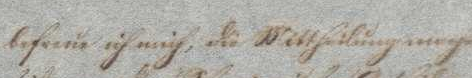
befreue ich mich, die Mittheilung machen
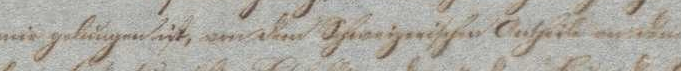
mir gelungen ist, von dem Schweizerischen Antheile an dem
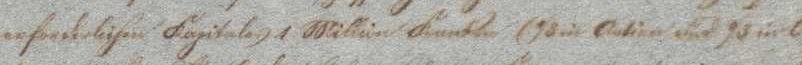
erforderlichen Kapitales 1 Million Franken (⅓ in Actien und ⅔ in Obliga-
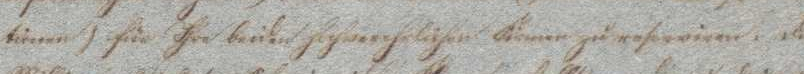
tionen) für Ihre beiden hochverehrlichen Firmen zu reserviren. Diese
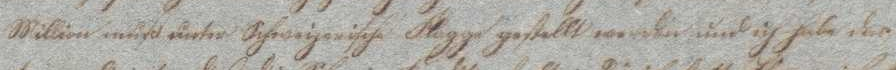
Million muß unter Schweizerische Flagge gestellt werden und ich habe das
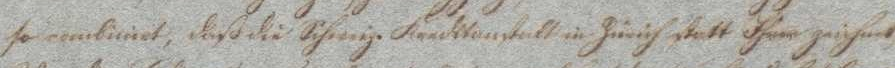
so combinirt, daß die Schweiz. Kreditanstalt in Zürich statt Ihrer zeichnet.
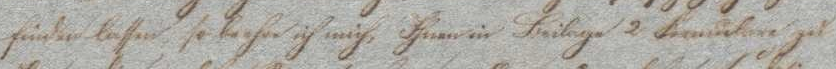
finden lassen, so beehre ich mich, Ihnen in Beilage 2 Formulare zu
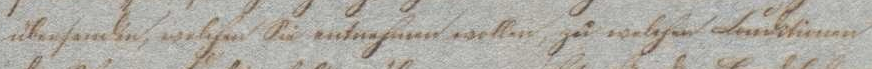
übersenden, welchen Sie entnehmen wollen, zu welchen Conditionen
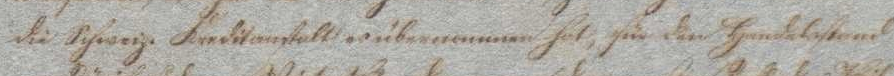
die Schweiz. Kreditanstalt es übernommen hat, für den Handelsstand
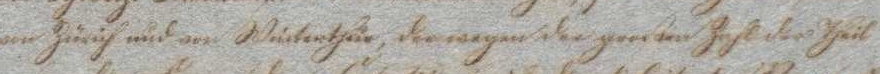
von Zürich und von Winterthur, der wegen der großen Zahl der Theil
